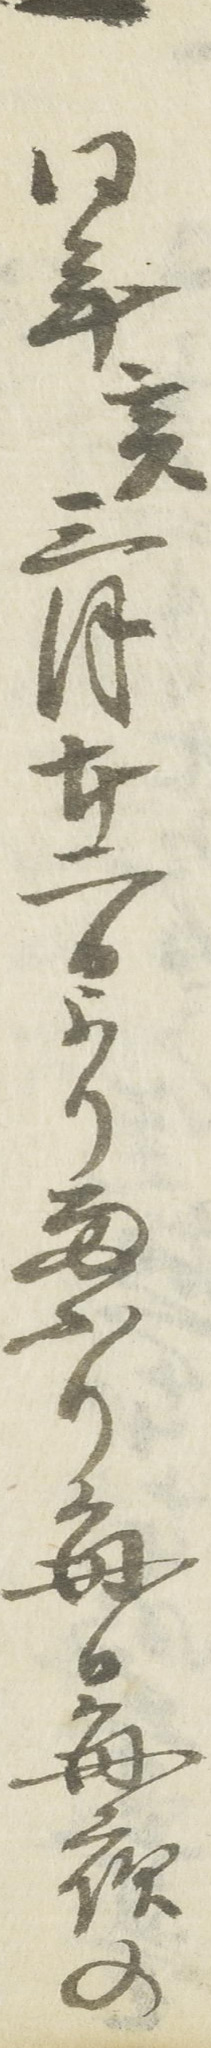一同年亥三月二十二日より雨ふり毎日毎夜の
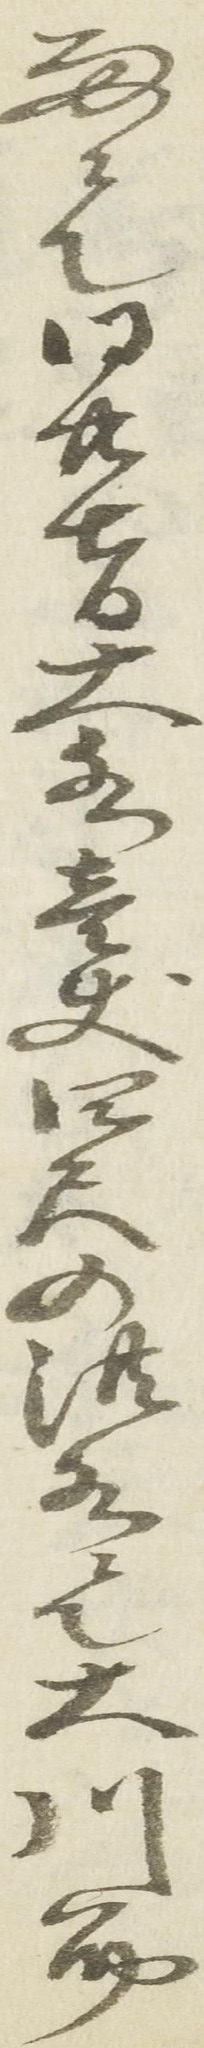雨ニて同廿七日大水壱丈四尺の洪水ニて大川筋
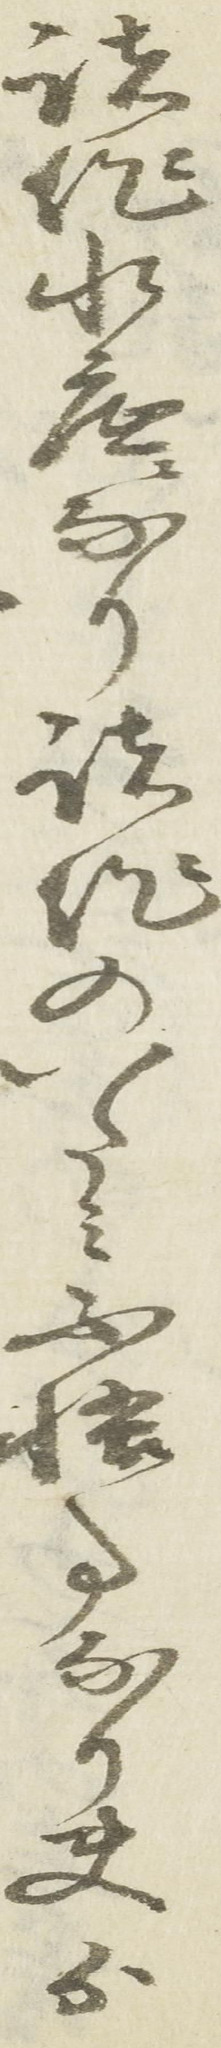諸作水底ニなり諸作のいたみ不快事なり夫ゟ
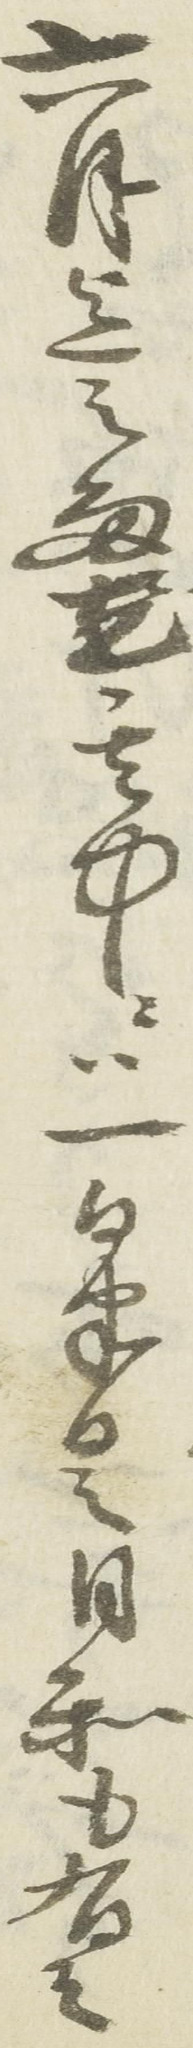六月迄之雨尤其中ニは一日半日之日和も有之
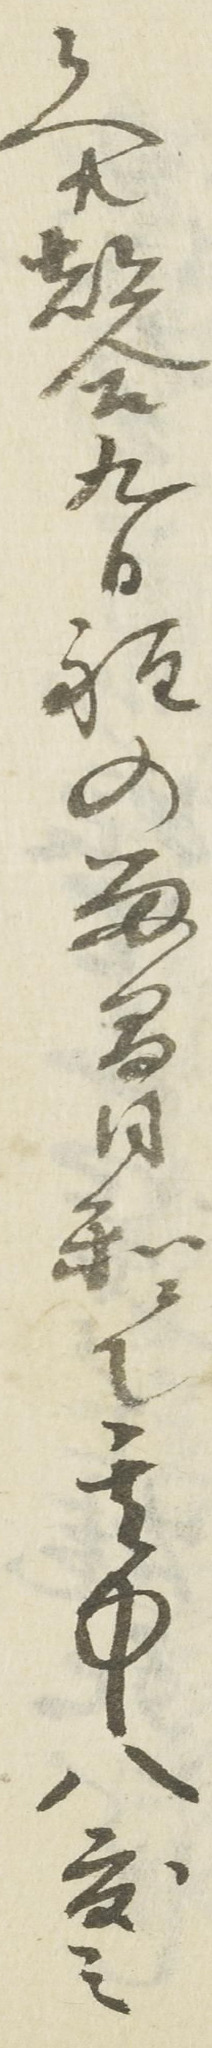候へ共都合九日程の雨間日和ニて其中八度之
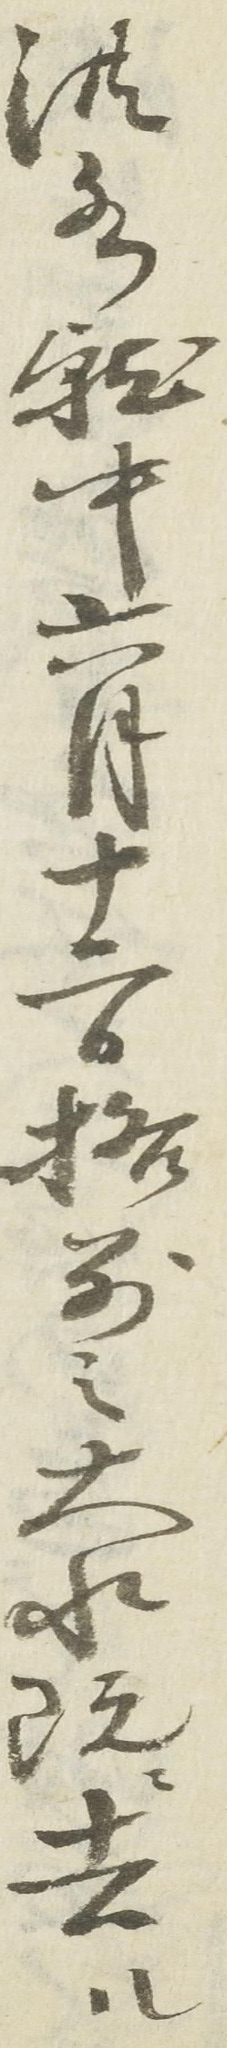洪水就中六月十二日格前之大水既ニ去ル
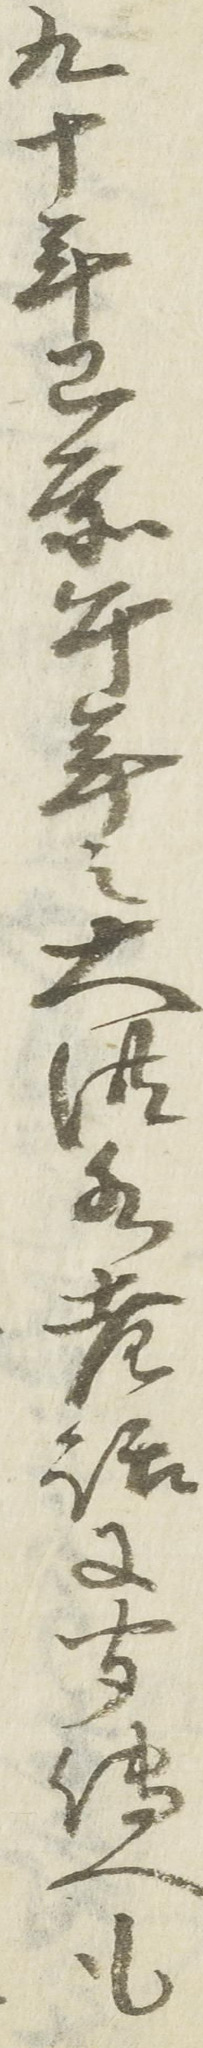九十年已然午年之大洪水老話に聞伝へも
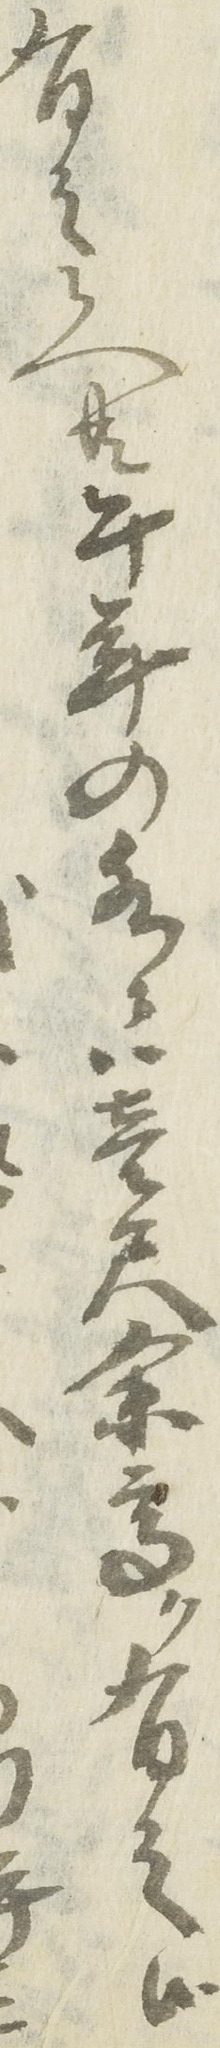有之候へ共午年の水ニは壱尺余高ク有之候
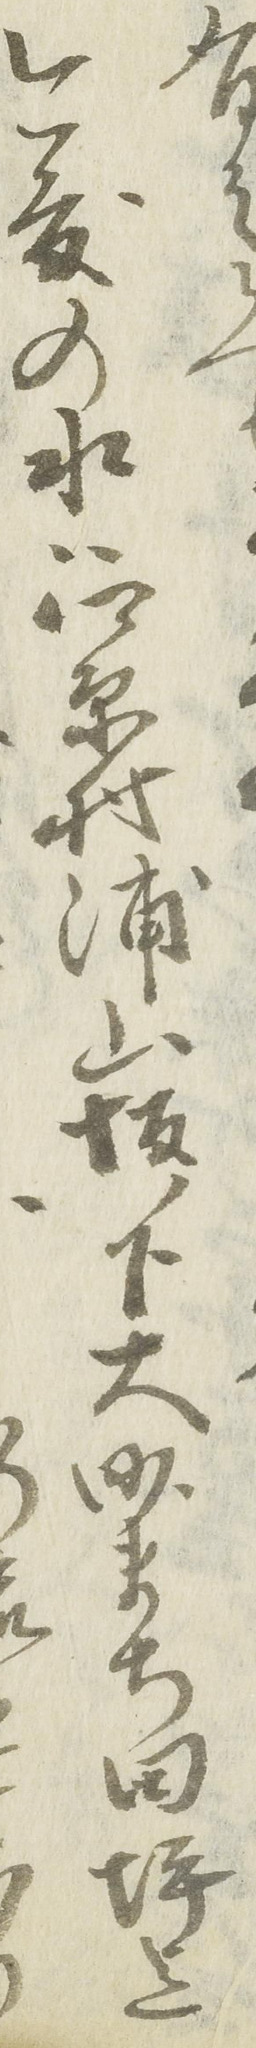今度の水は郷原村浦山坂ノ下大町まち田坪迄
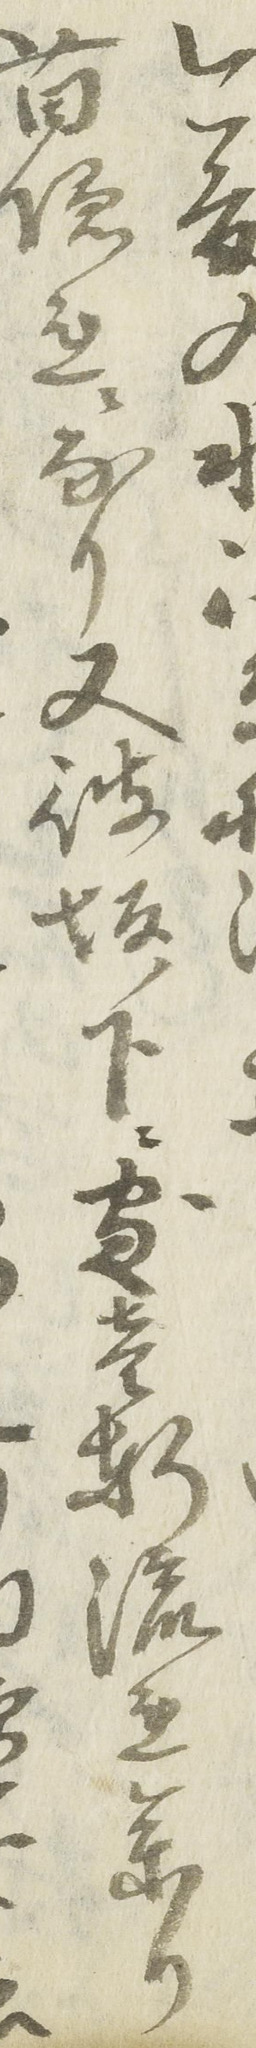苗隠れニなり又彼坂ノ下ニ家壱軒流れ参り
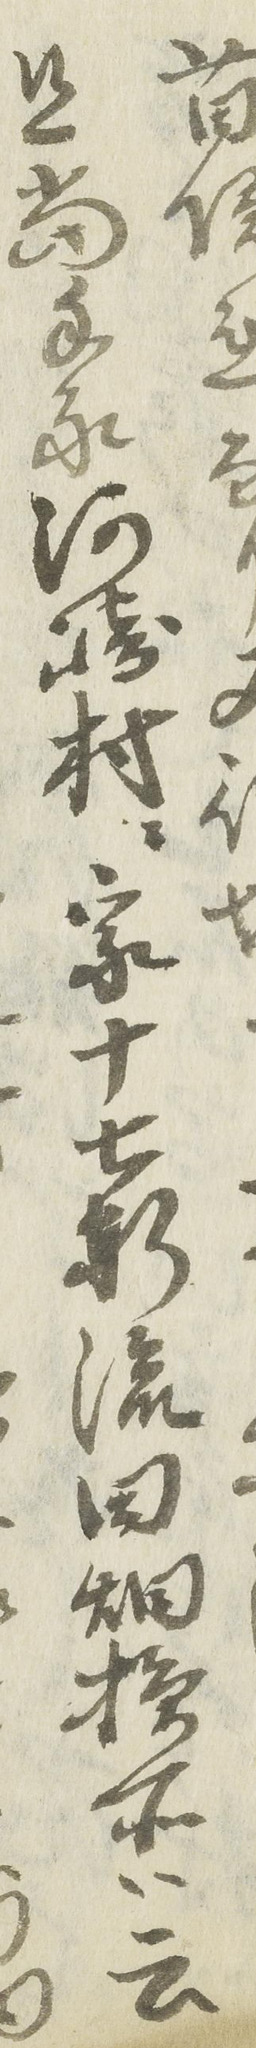且当手永河崎村ニ家十七軒流田畑損所は云
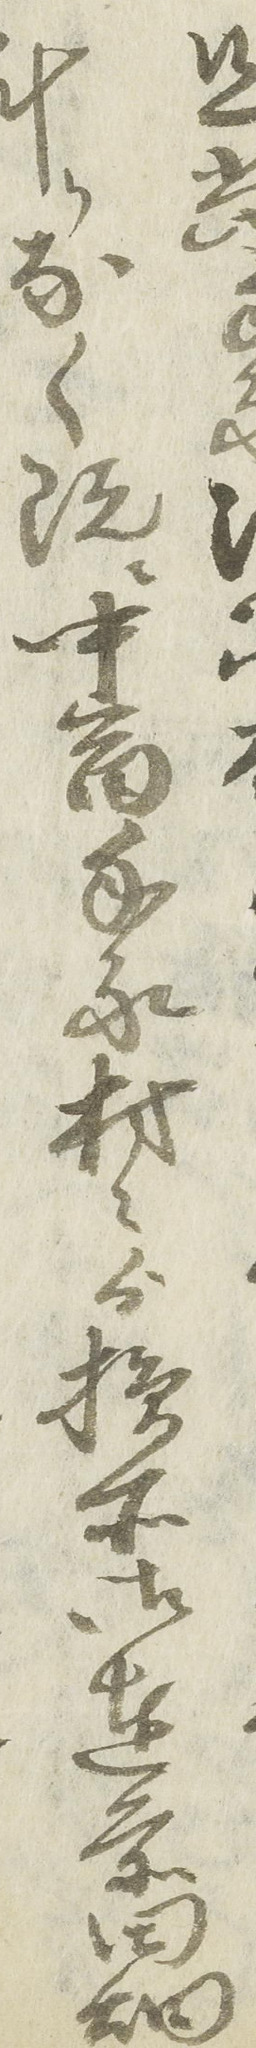計りなく既ニ中富手永村〻ゟ損所御達前田畑
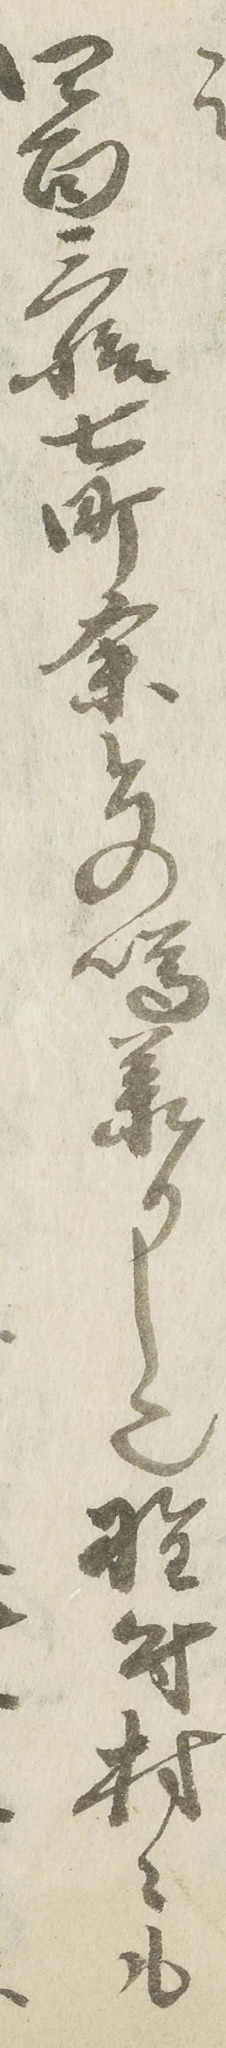四百三拾七町余との噂承りし也野付村〻も
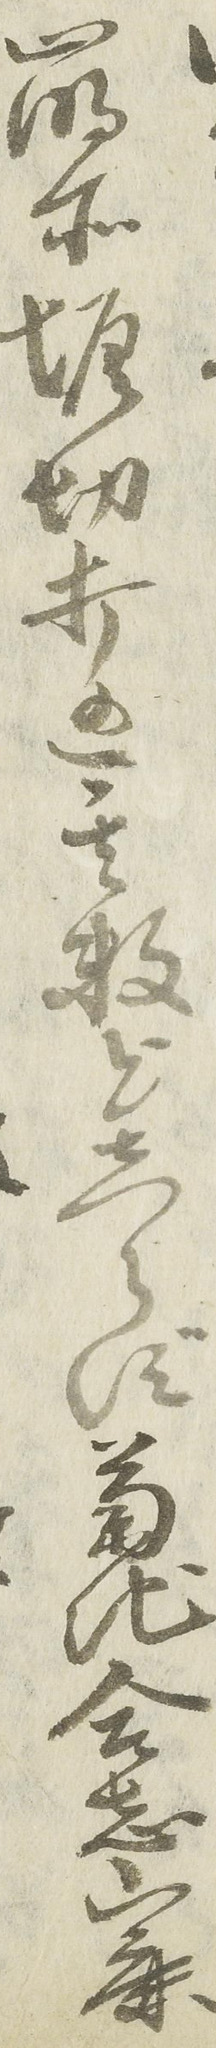崩所堀切打込其数をしらず菊池合志山鹿
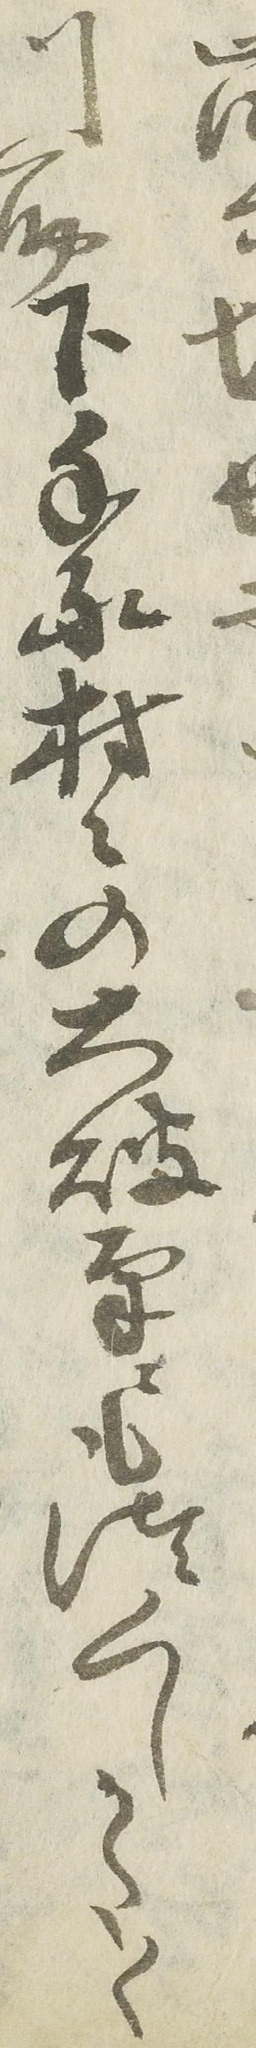川筋下手永村〻の大破筆ニもつくしかたく
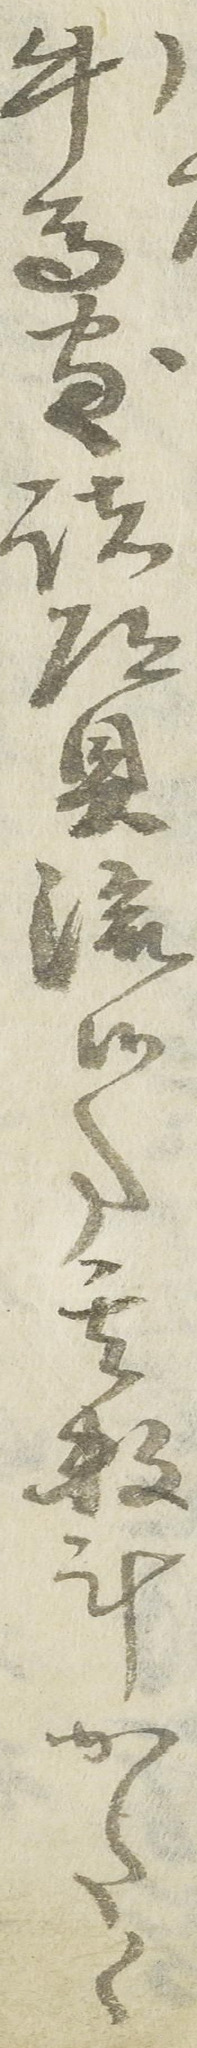牛馬家諸道具流候事其数計かたく
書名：後見笑
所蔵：東京大学地震研究所図書室 Earthquake Research Institute Library, The University of Tokyo, JAPAN
